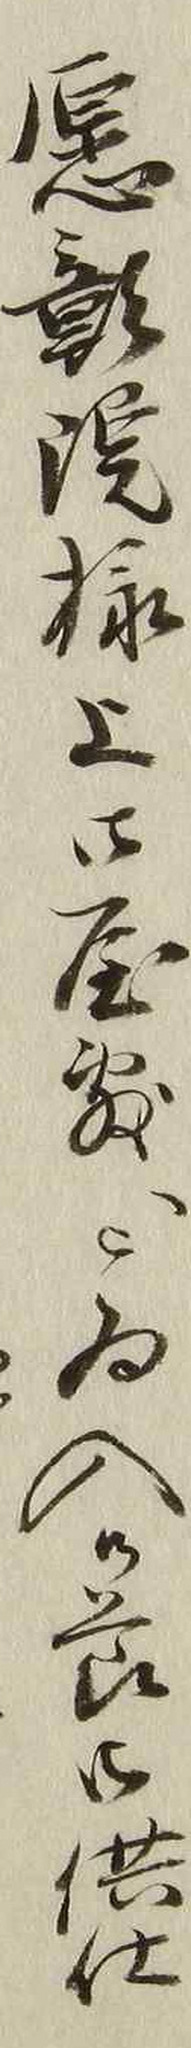愿彰院様上御屋敷へ被為入候節御供仕
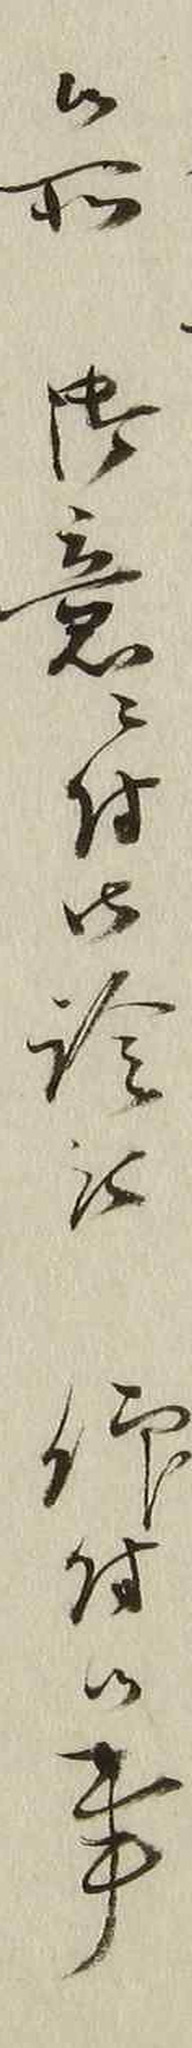候所御意に付御診被仰付候事
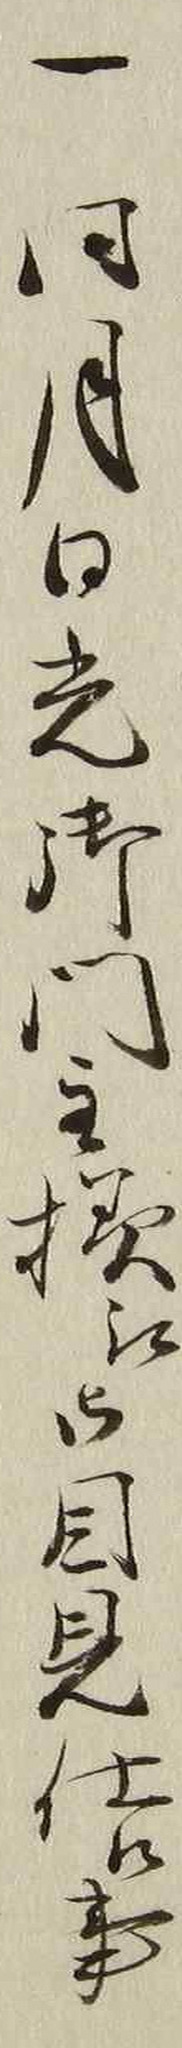一同月日光御門主様江御目見仕候事
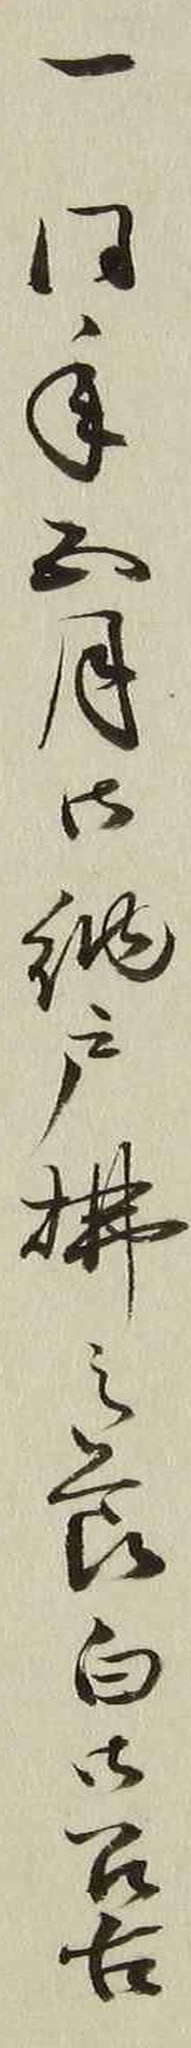一同年五月御納戸払之節白御召古
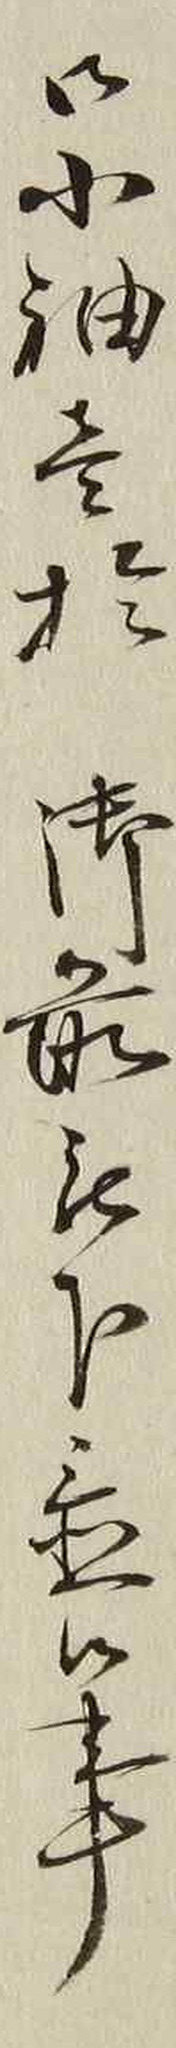御小袖壱於御前被下置候事
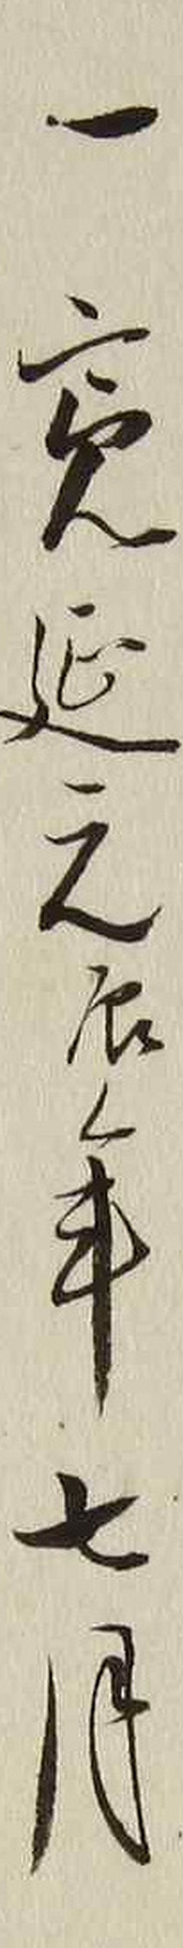一寛延元辰年七月
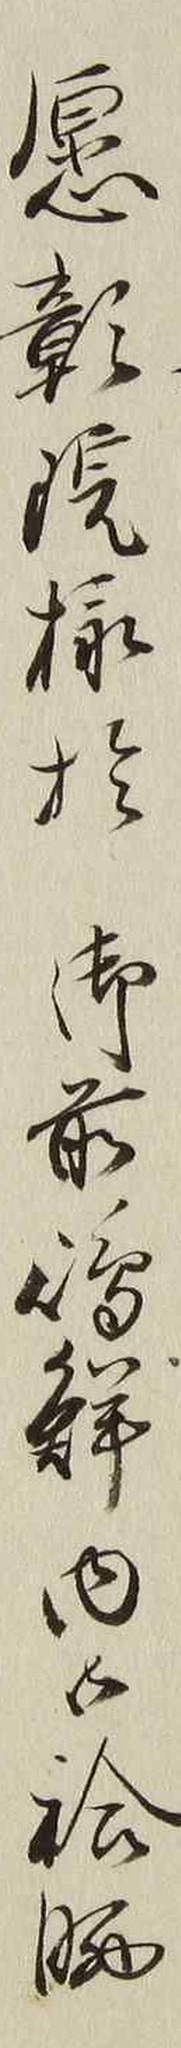愿彰院様於御前嶋鮮内御袷晒
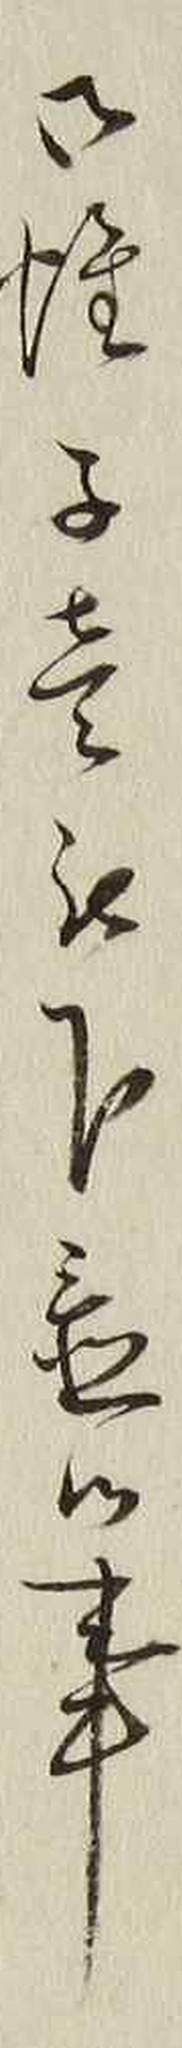御帷子壱被下置候事
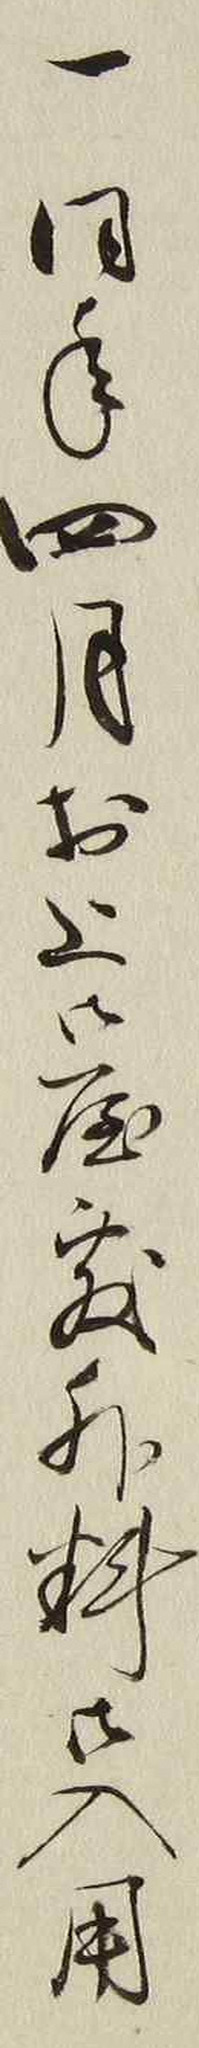一同年四月於上御屋敷外料御入用
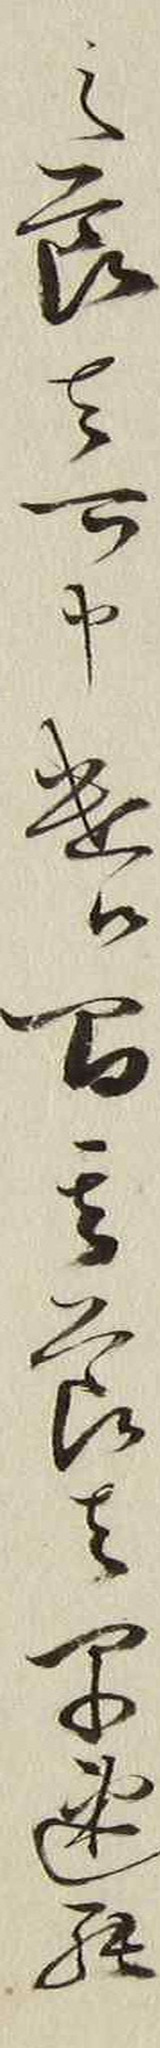之節は可申遣候間其節は早速罷
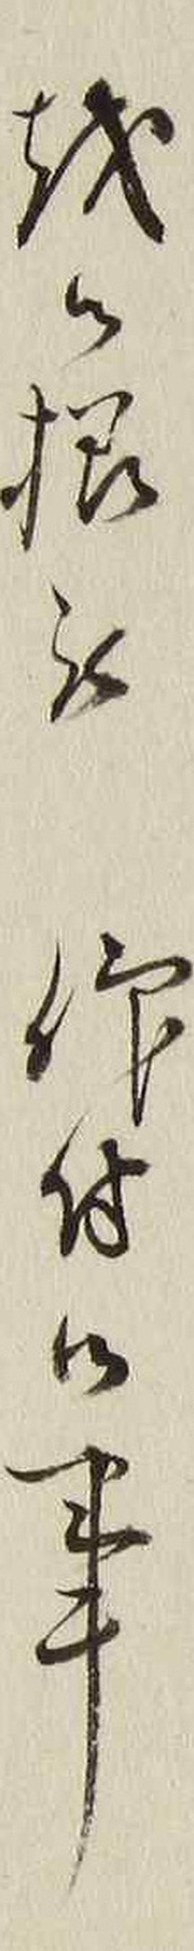越候様被仰付候事
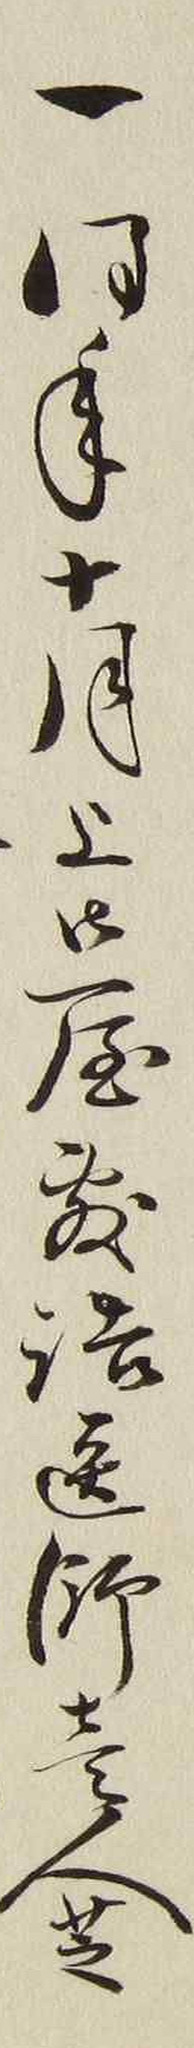一同年十月上御屋敷詰医師壱人芝
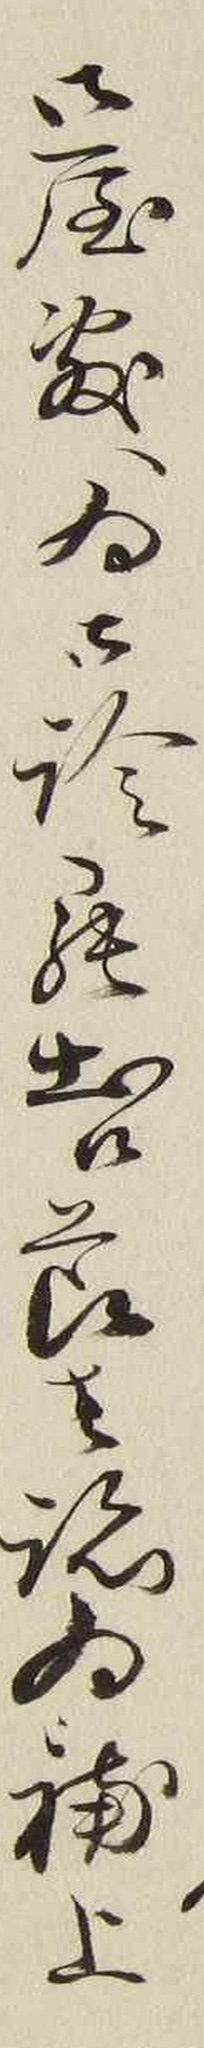御屋敷へ為御診罷出候節は跡為補上
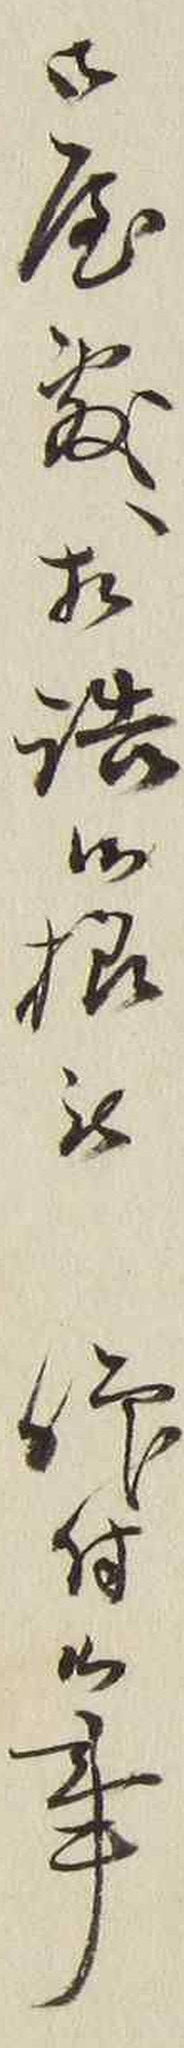御屋敷へ相詰候様被仰付候事

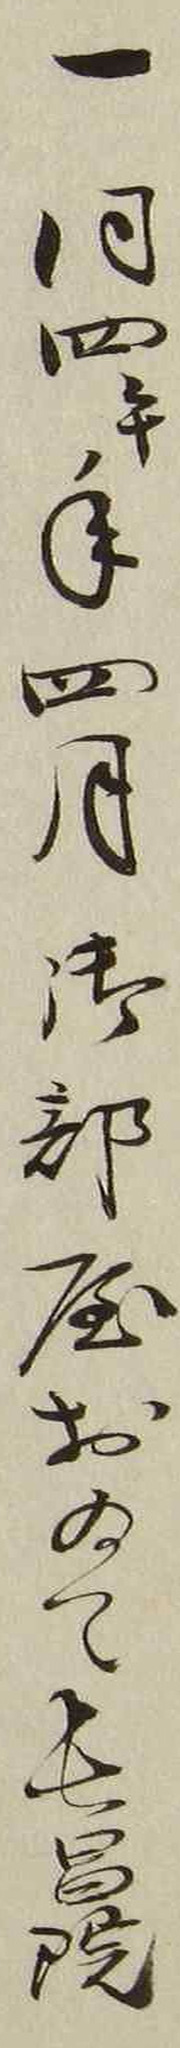一同四午年四月御部屋おゐて長昌院
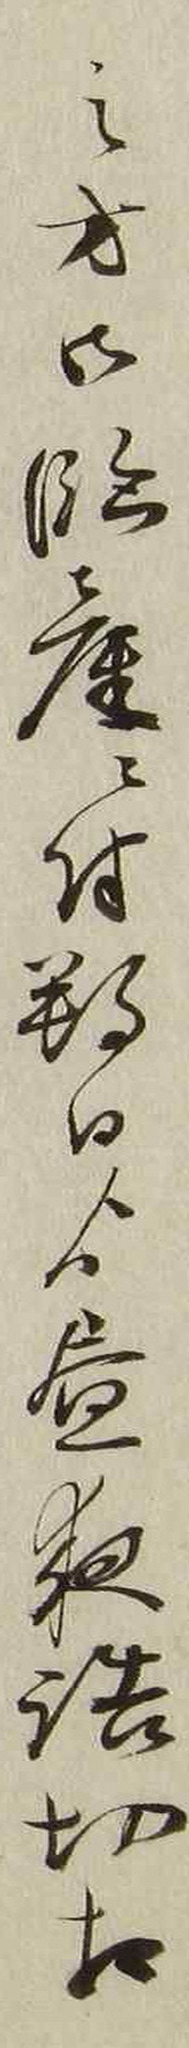之方御臨産に付朔日ゟ昼夜詰切相
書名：諸士系譜　巻之157　ね之部1
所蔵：会津若松市立会津図書館
